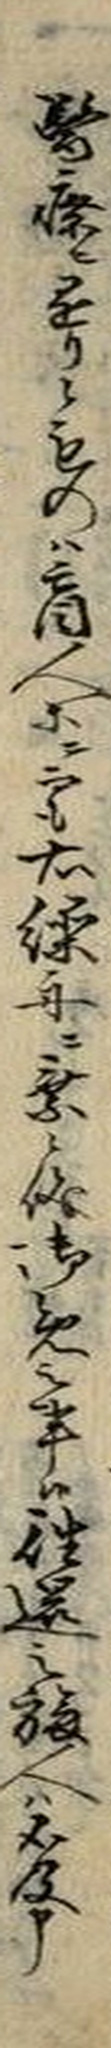医療に懸り候ものは盲人等にても右繰舟に乗候儀御免之事候往還之旅人は不及申
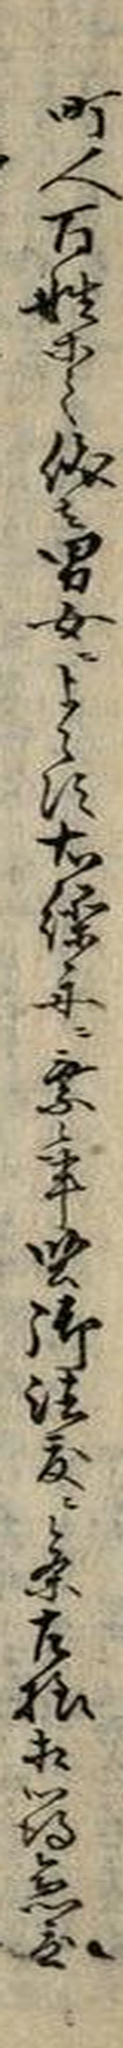町人百姓等之儀は男女によらす右繰舟に乗候事堅御法度に候条左様相心得急度
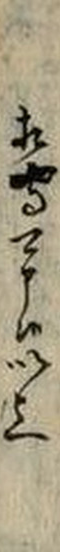相守可申候以上
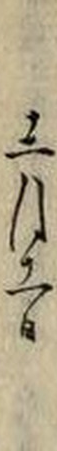十二月十一日
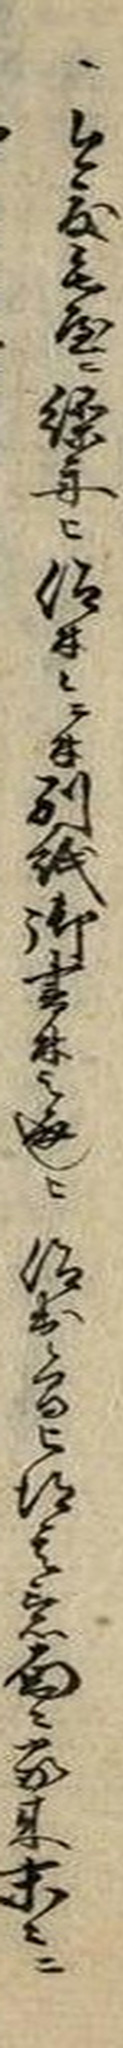・今度毛屋に繰舟被仰付候に付別紙御書付之通被仰出候間被得其意面々家来末々に
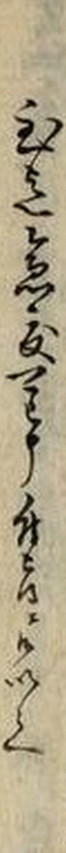至迄急度可被申付旨に候以上
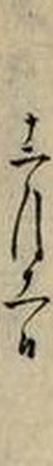十二月十一日
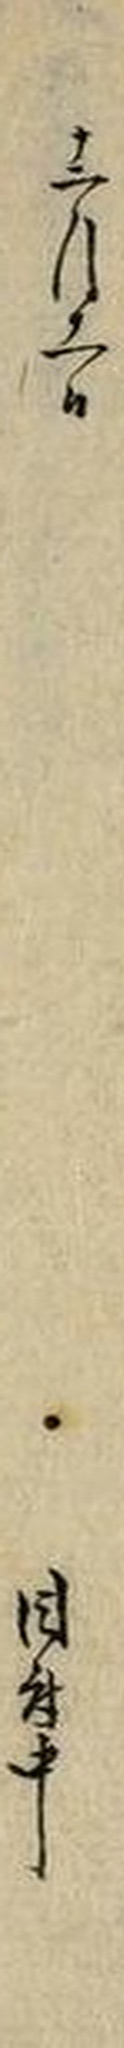十二月十一日目付中
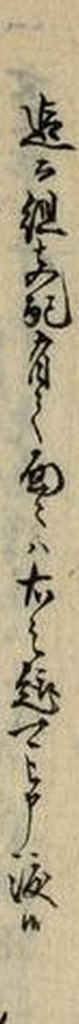追て組支配之有之面々は右之趣可被申渡候
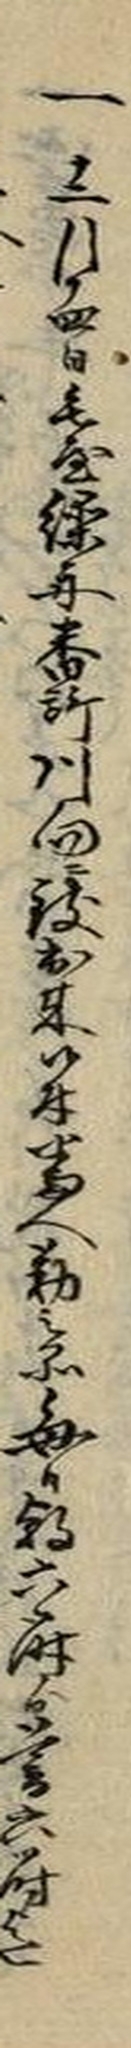一十二月十四日毛屋繰舟番所川向に致出来候付番人勤之品毎日朝六ツ時ゟ暮六ツ時迄
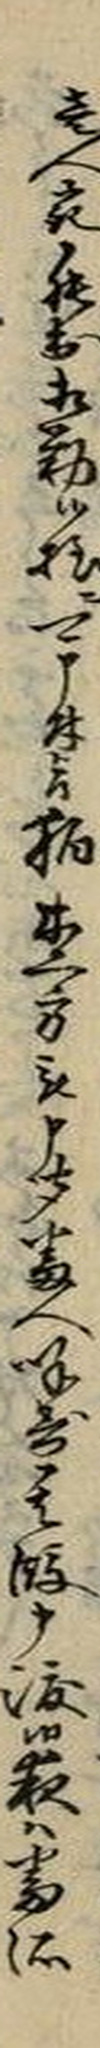壱人宛罷出相勤候様に可申付旨狛杢方被申聞番人呼寄其段申渡候夜は番所
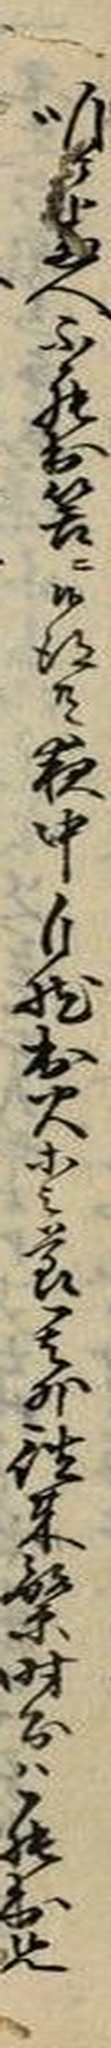明ケ番人不罷出筈に候得共夜中自然出火等之節其外往来繁時分は罷出見
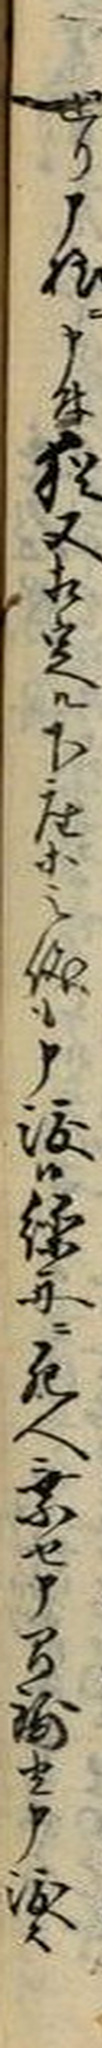廻り申様に申付猶又相定ル下座等之儀も申渡候繰舟に死人乗セ申間舗由申渡ス
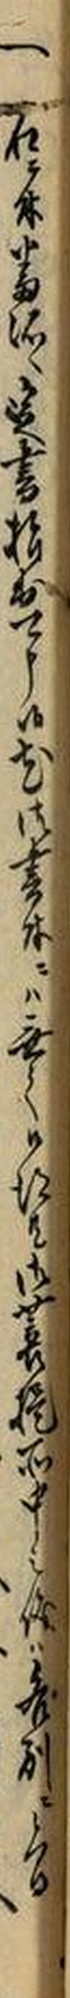一右に付番所へ定書指出可申候尤御書付には無之候得共御菩提所中之儀は各別に候間
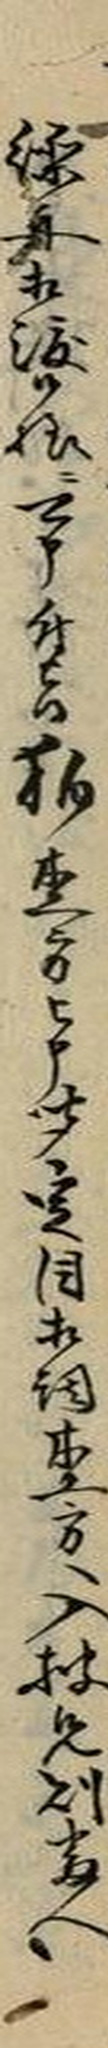繰舟相渡候様に可申付旨狛杢方被申聞定目相調杢方へ入披見則番人
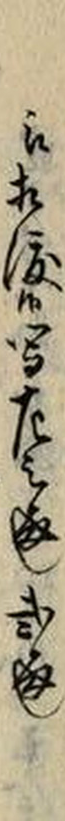え相渡候写左之通弐通
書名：御城下諸事之部
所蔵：福井県文書館 Fukui Prefectural Archives
